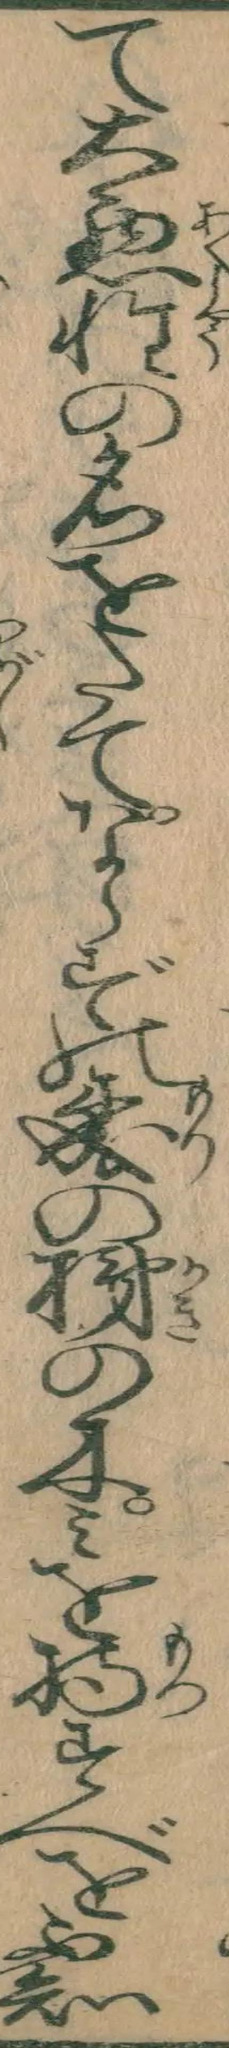て大悪性の名をたて。ならずの森の柿の木。みを持すべを不知
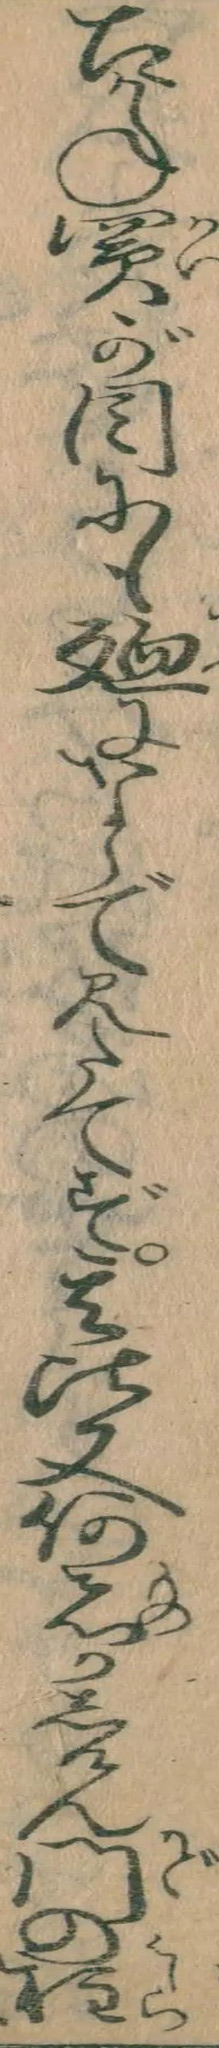古かね買が目にも殈にならで見たてず。其比又何者かしけん門の柱に
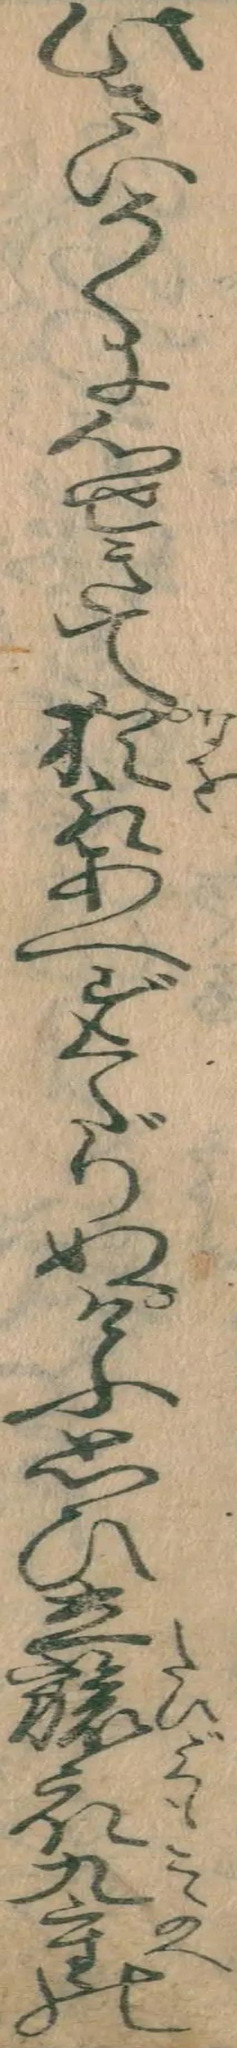此さいそくに心せきて猶取あへずくだりぬ。けふ思ひ立旅衣九重の
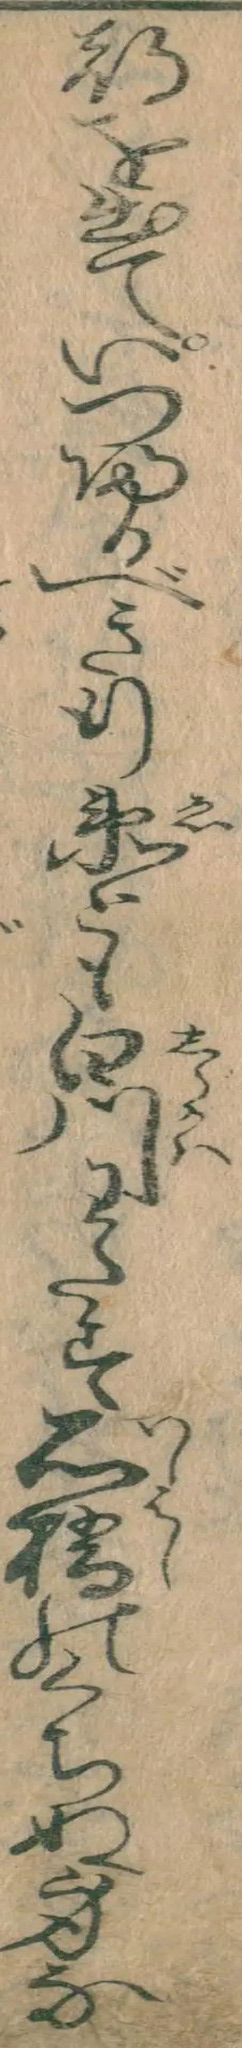都を出て。いつ帰るべき行衛とも白川わたす石橋のくちぬ身な
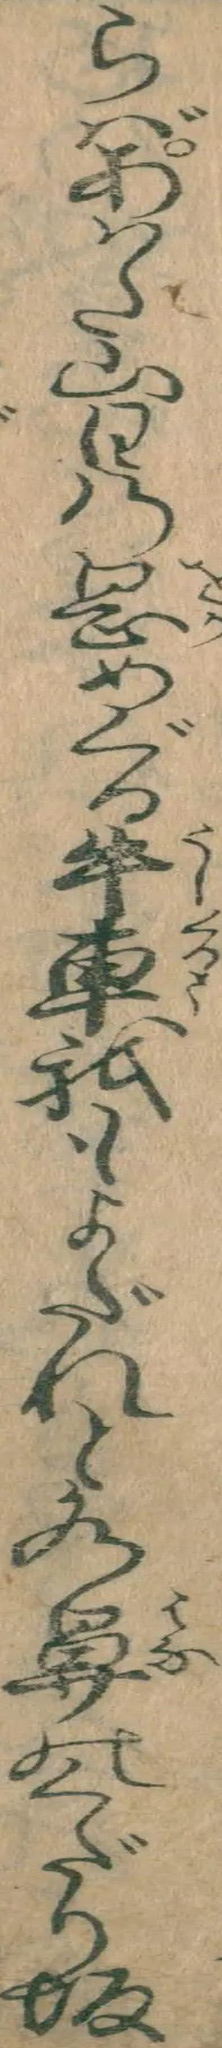らば。あはた山日の岡めぐる牛車我もよだれと水鼻のくだり坂
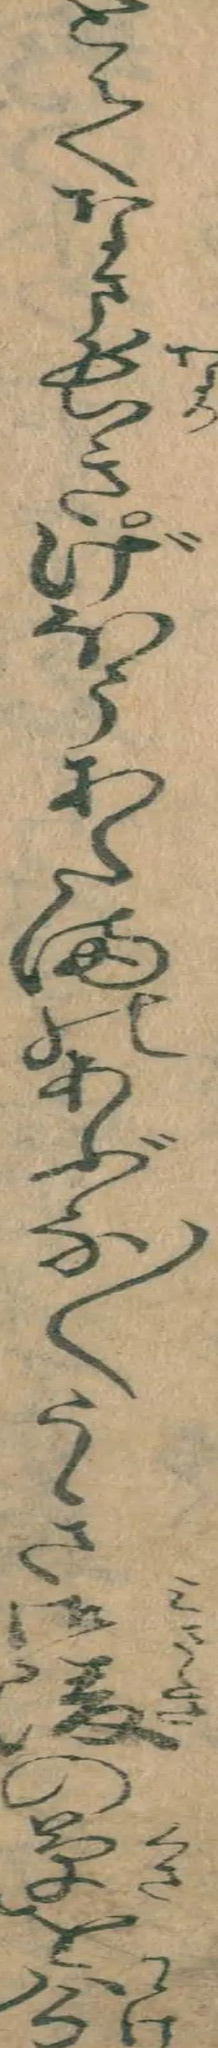とてなま長き。げほうあたまのあぶな〳〵うき御陵の草を分

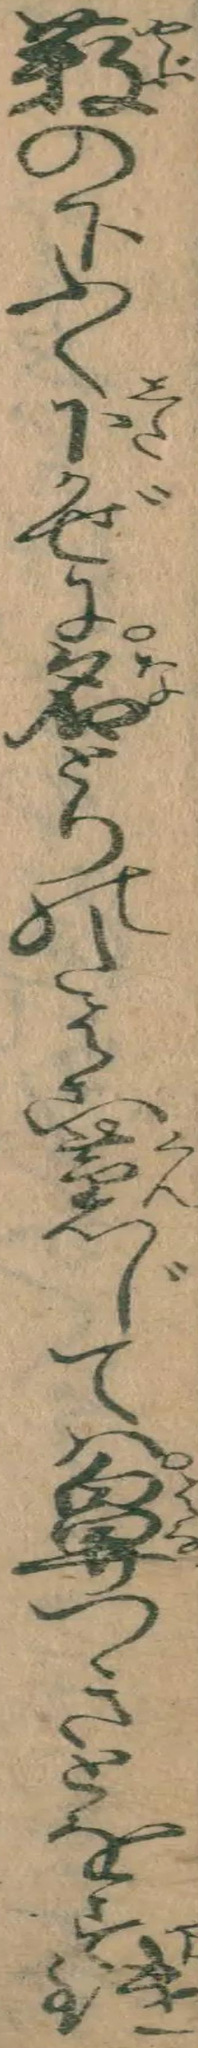薮の下ふく下かぜに。名とりのたはこ薫じては。鼻つきとをす鑓
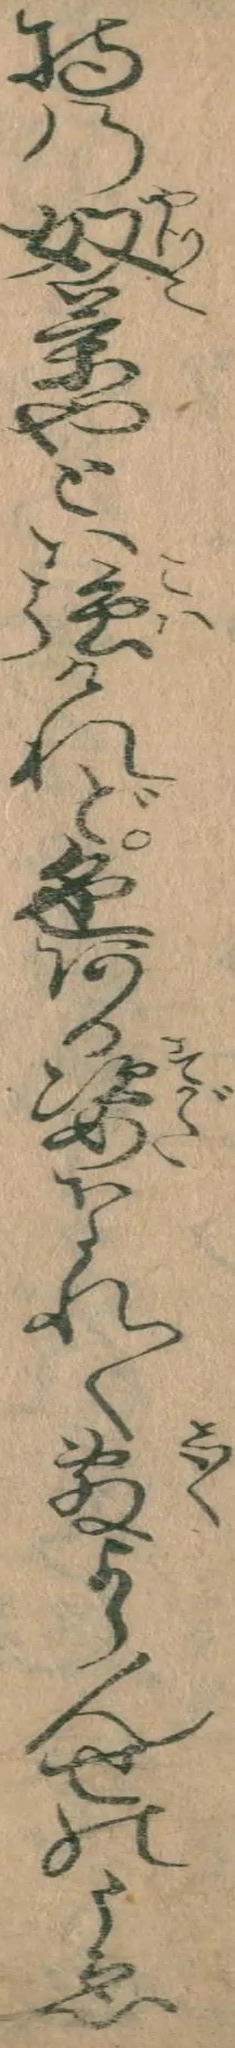持の奴茶やとは強けれど。色ある姿なれ〳〵敷よらんせのこゑ
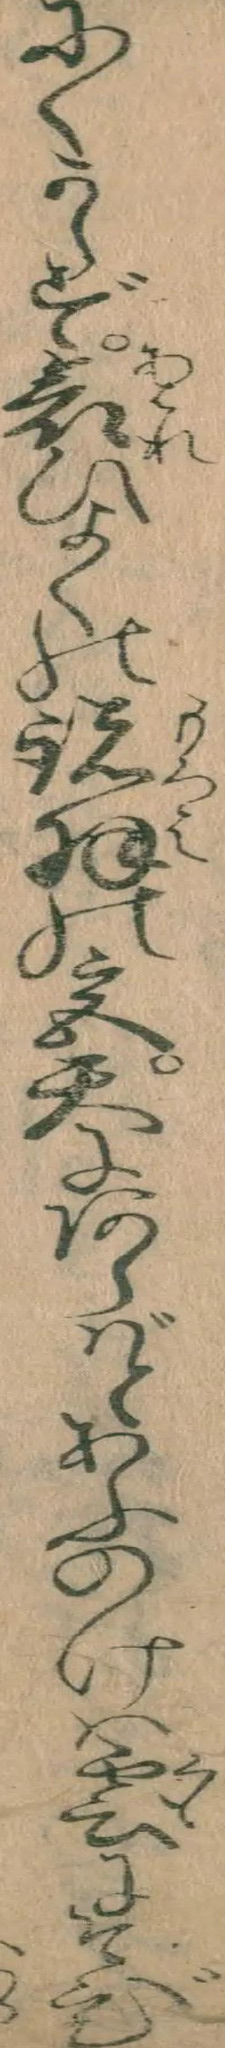にくからず。哀ひよくの諸羽の宮。天にあらばとあふのけは雲にそび
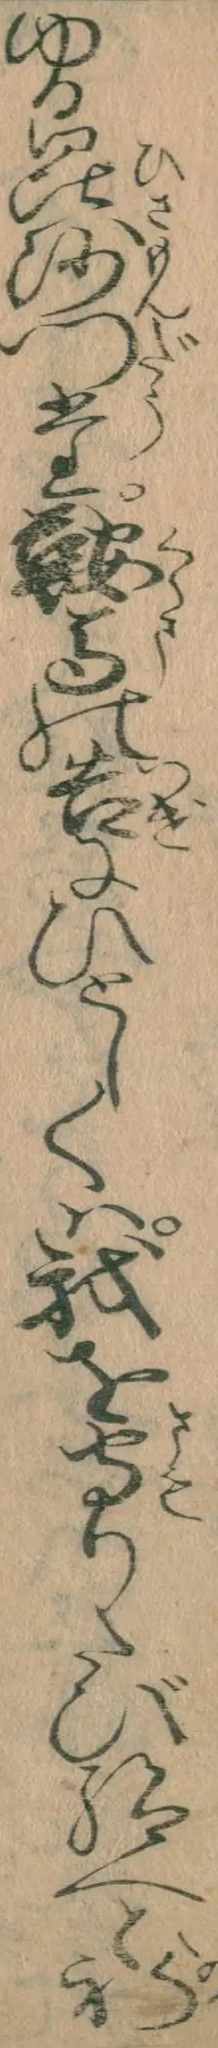ゆる毘沙門堂。鞍馬の告にひとしくは。我を守りたび給へと祈
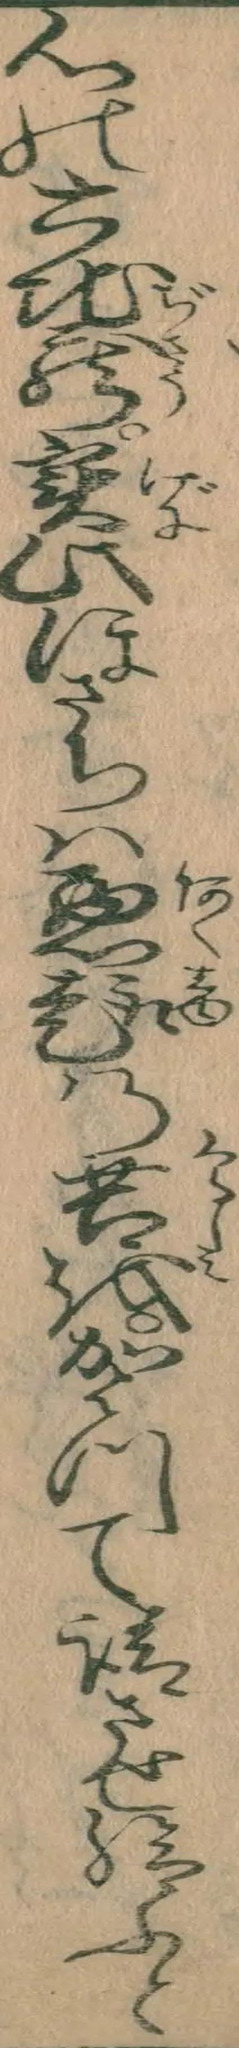心の六地蔵。実此ほさつは悪趣の苦を。かはつて請させ給ふと
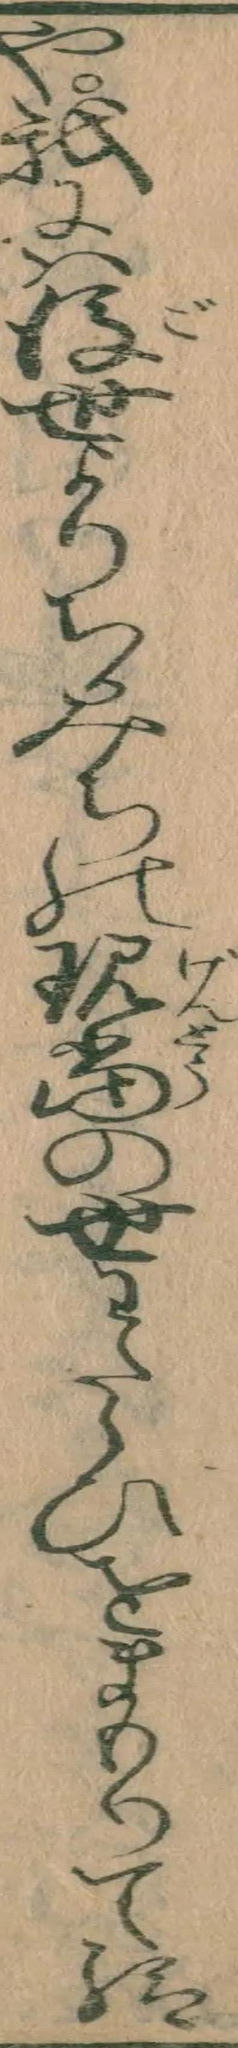や。我には後世よりちかみちの現当の世わたらひをまもりて給
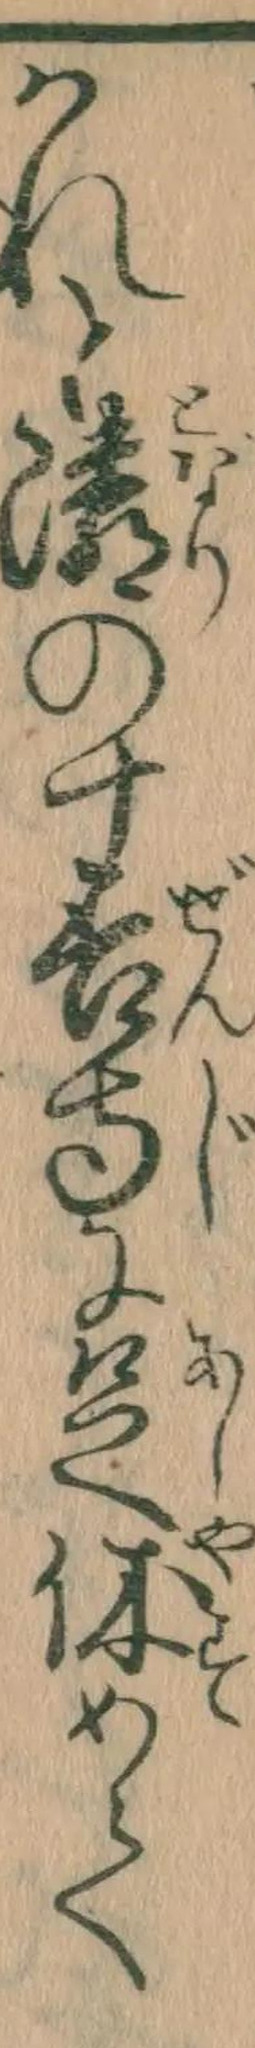はれと隣の十善寺に足休めて
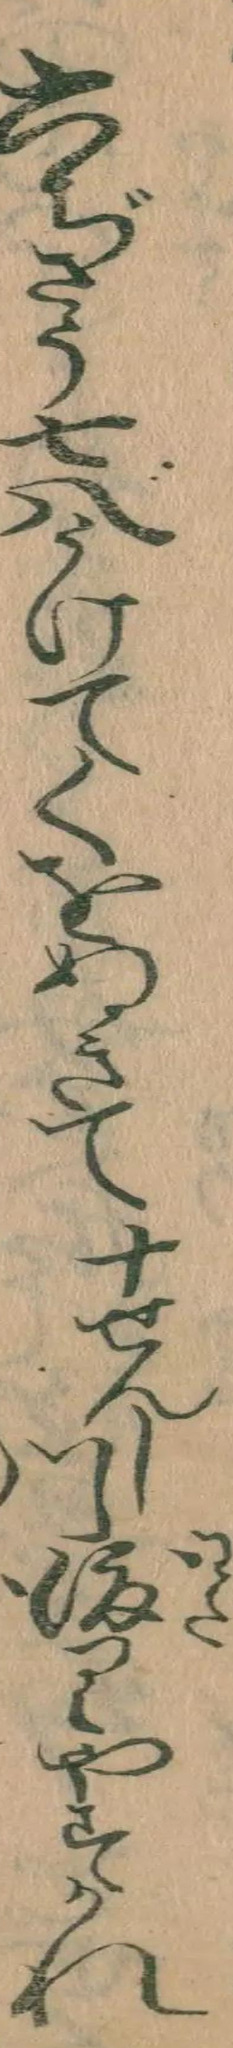六ぢさう七八うけてくをぬきて十せんし川渡りやすかれ
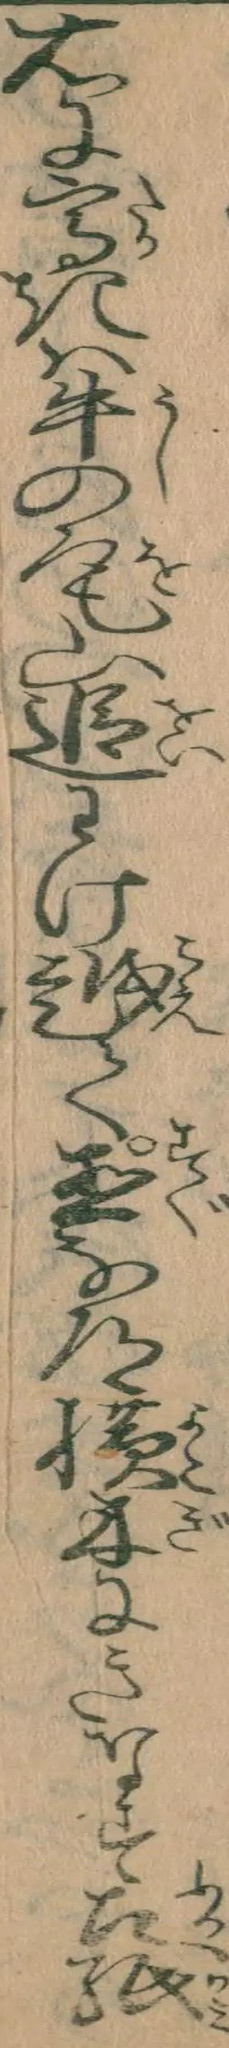右に高きは牛の尾山追わけ越て。直な道横木にきなす古紙
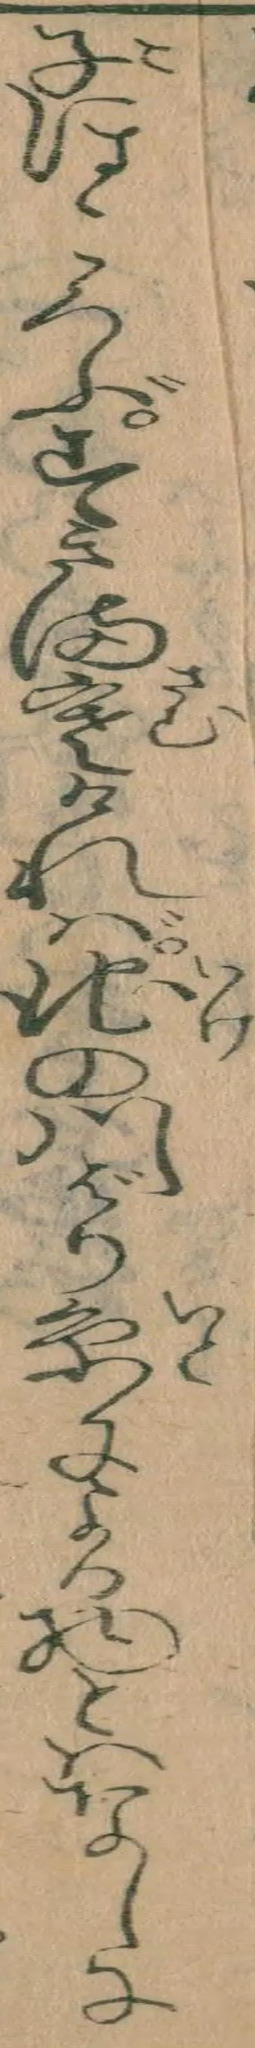子ほころぶ。すきま寒ければ。池の川ばり糸による物とはなしに
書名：新竹斎 5巻
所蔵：国立国会図書館 National Diet Library, JAPAN
